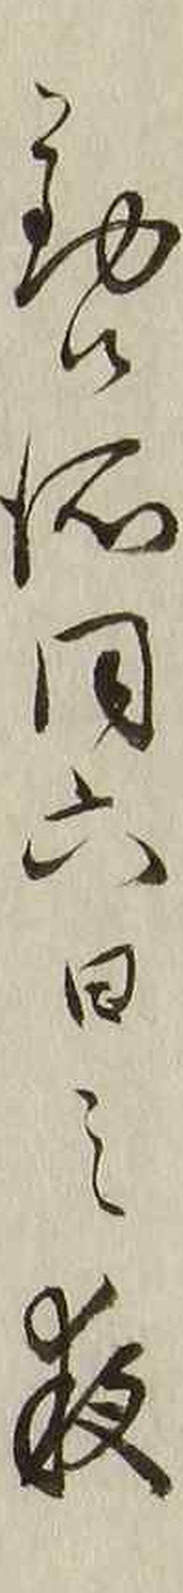勤候所同六日之夜
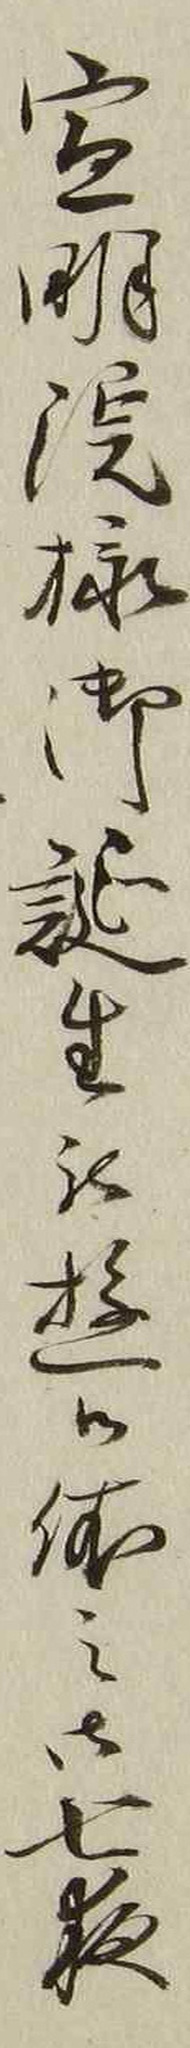宣明院様御誕生被遊候依之御七夜
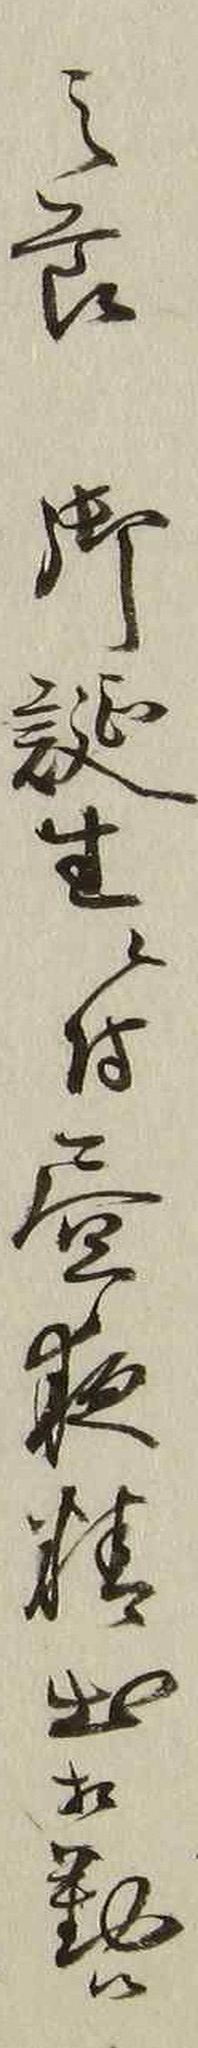之節御誕生に付昼夜精出相勤候
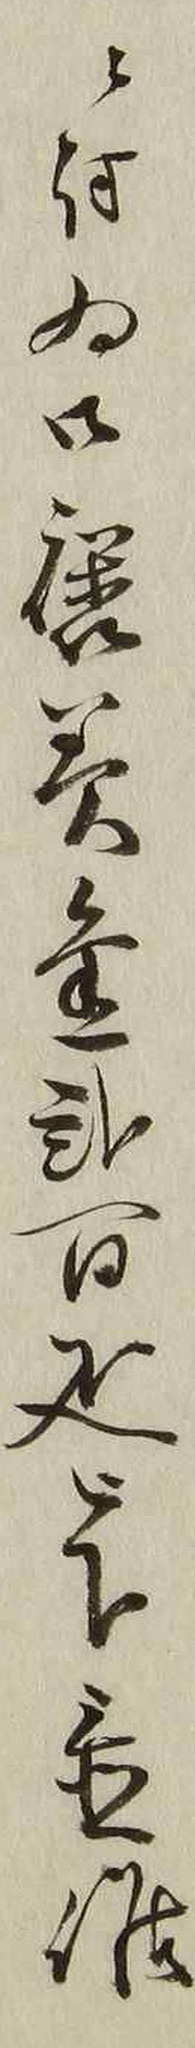に付為御褒美金弐百疋被下置候
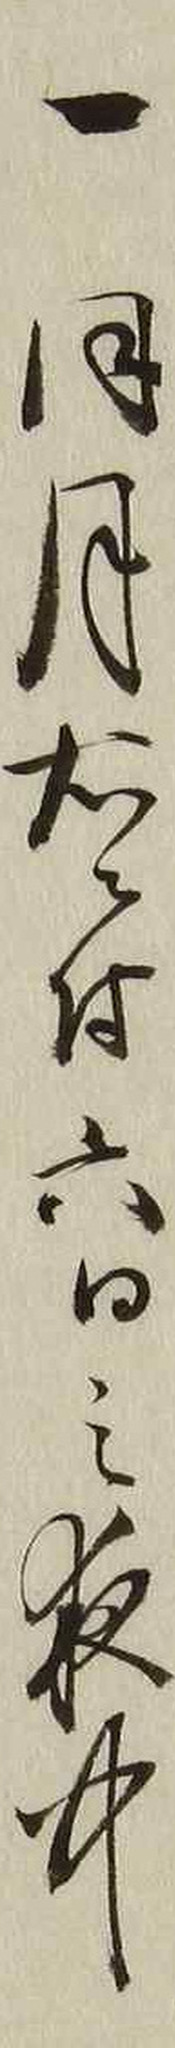一同月右に付六日之夜中
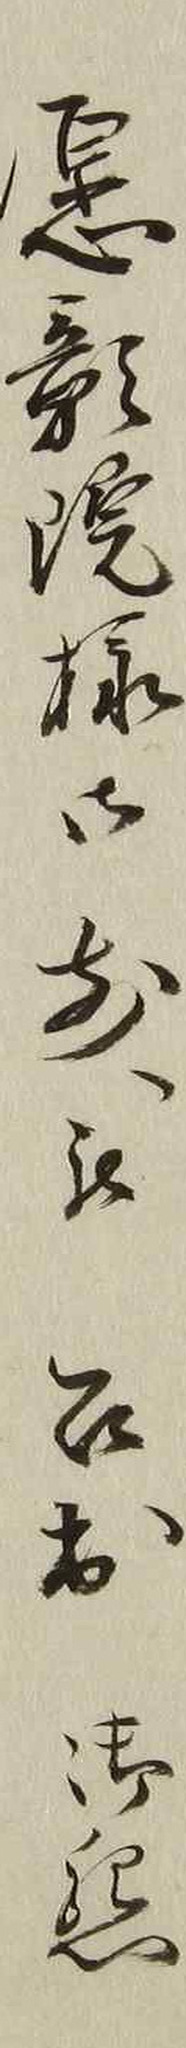愿彰院様御前へ被召出御懇
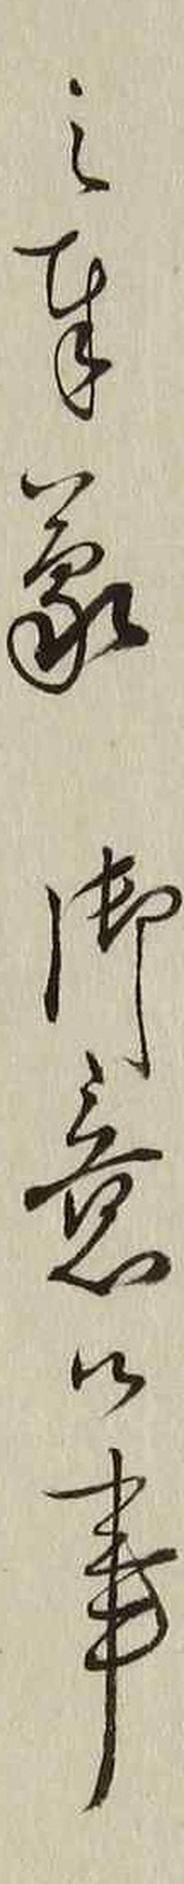之奉蒙御意候事
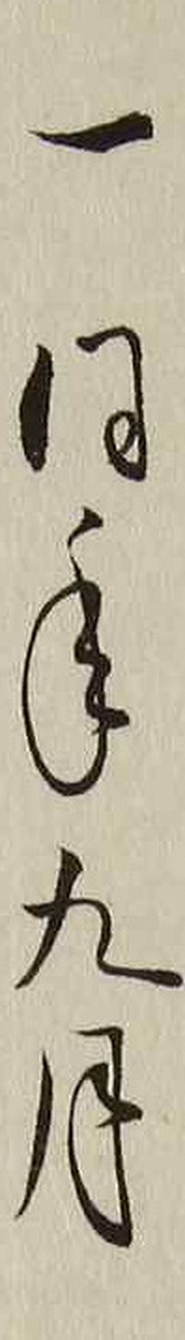一同年九月
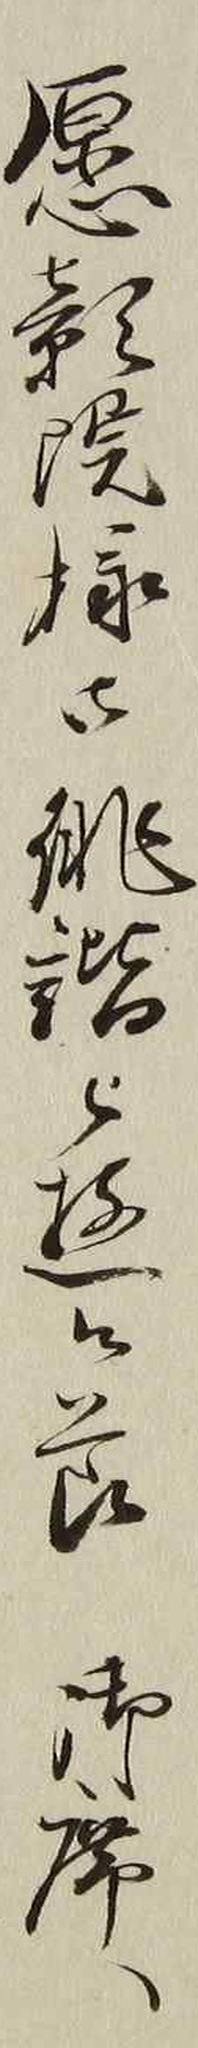愿彰院様御俳諧被遊候節御席へ
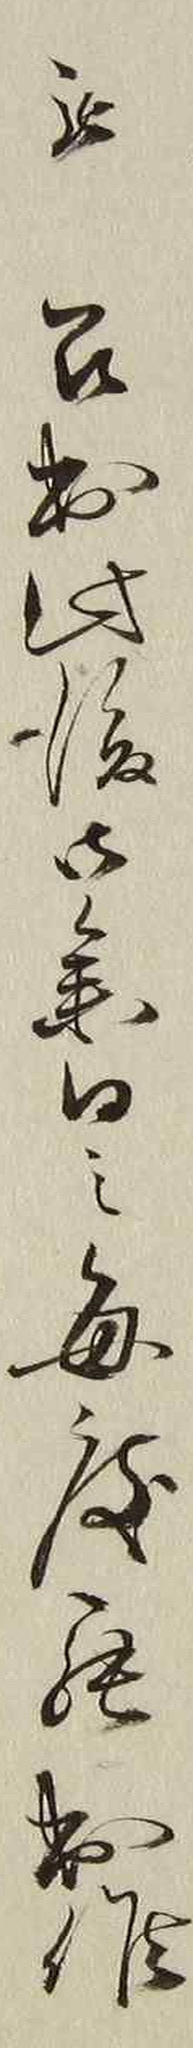被召出此後御参日之毎度罷出候
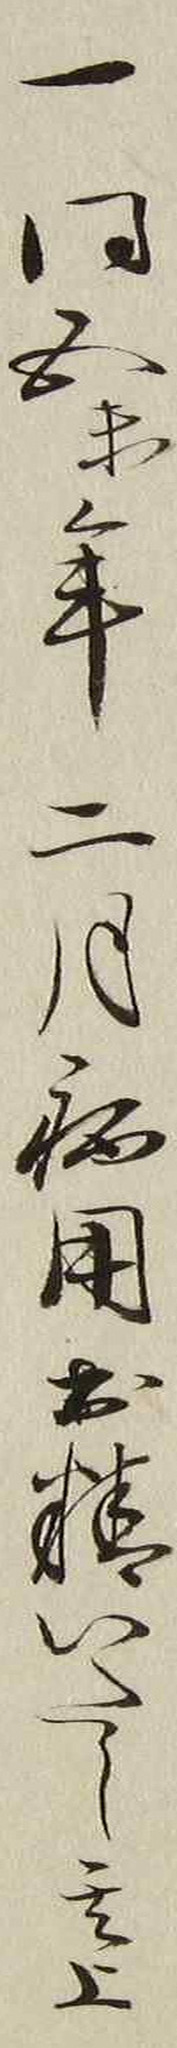一同五未年二月病用出精いたし其上
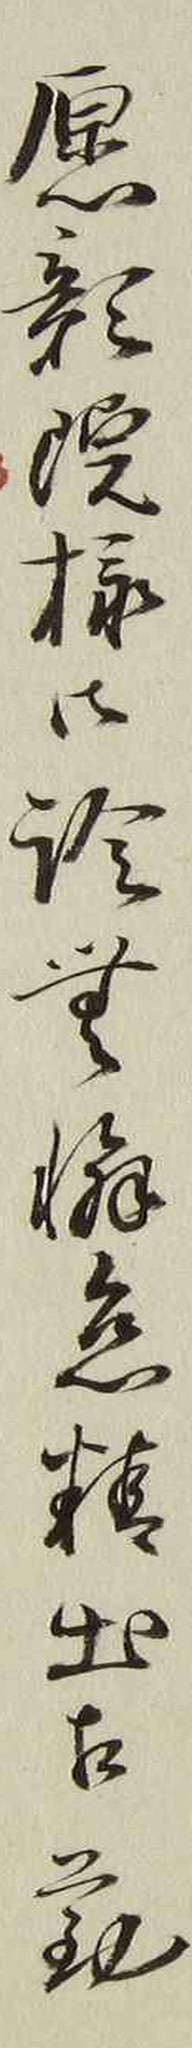愿彰院様御診無懈怠精出相勤
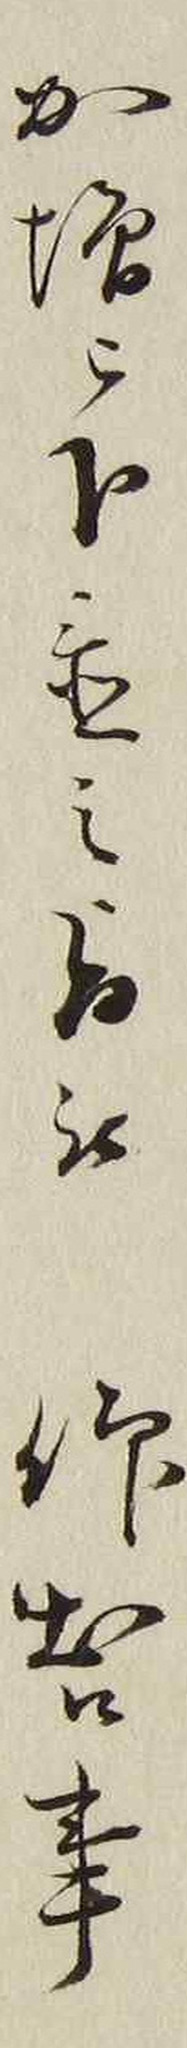加増被下置之旨被仰出候事
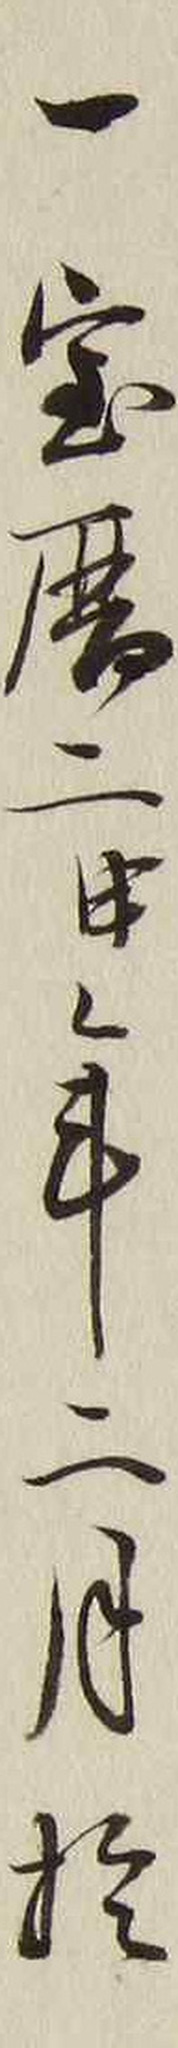一宝暦二申年二月於
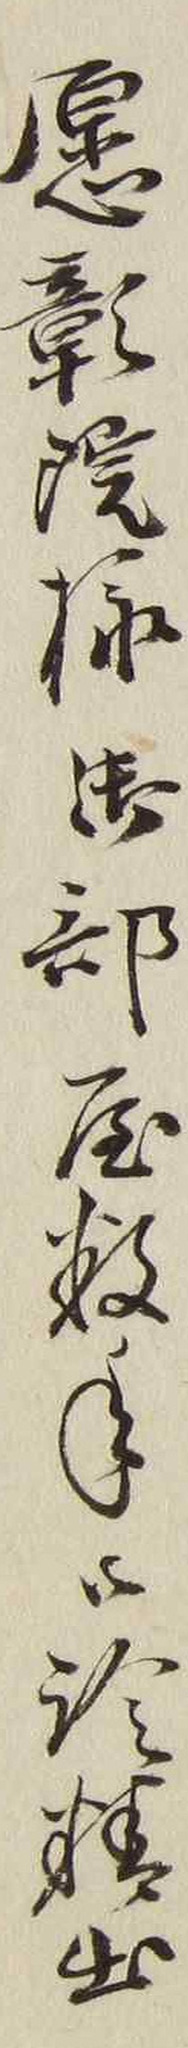愿彰院様御部屋数年御診精出

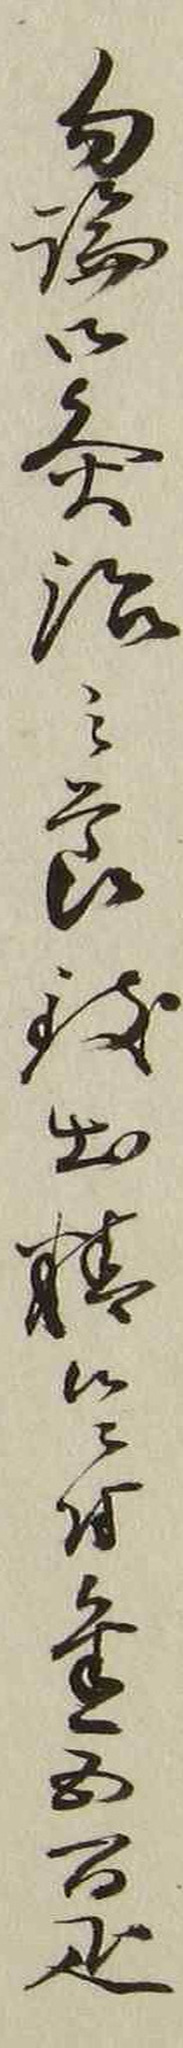勿論御灸治之節致出精候に付金五百疋
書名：諸士系譜　巻之157　ね之部1
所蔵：会津若松市立会津図書館
